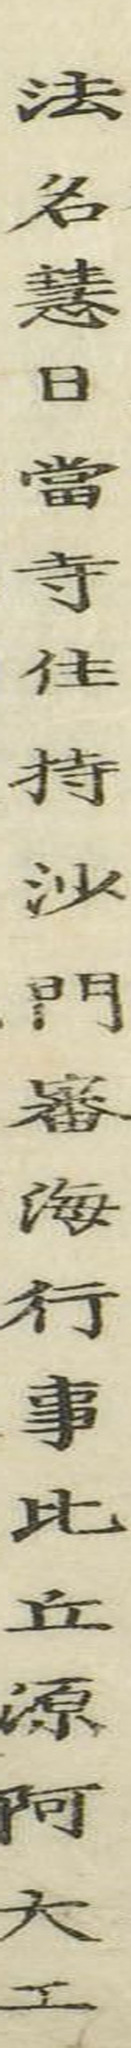法名慧日當寺住持沙門審海行事比丘源阿大工
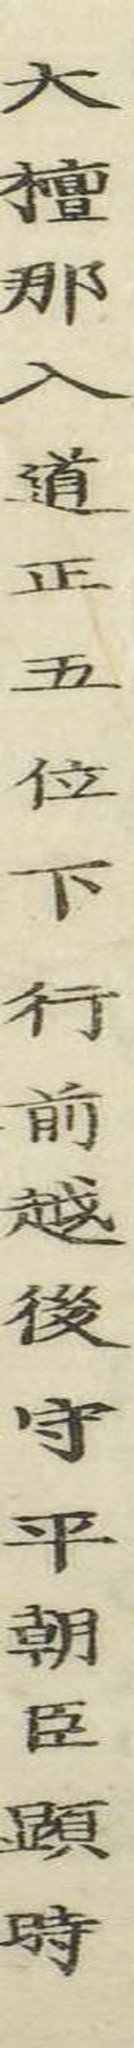大檀那入道正五位下行前越後守平朝臣顕時
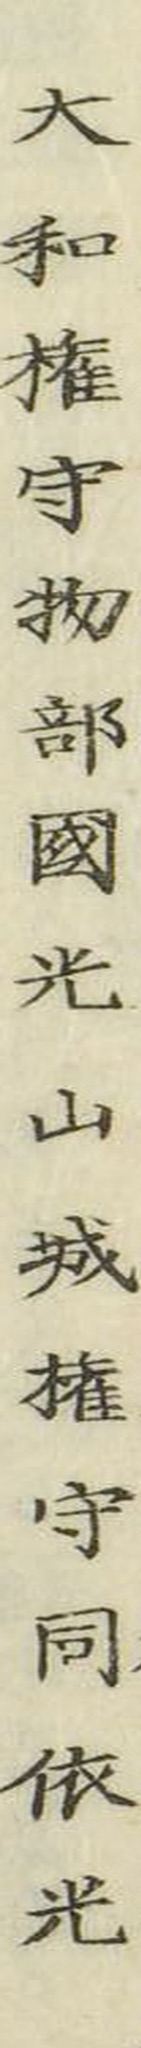大和権守物部國光山城権守同依光
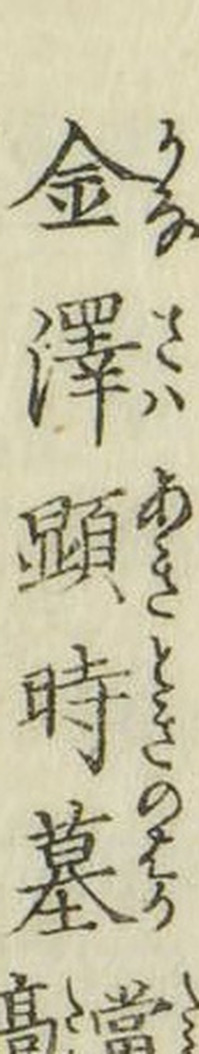金澤顕時墓

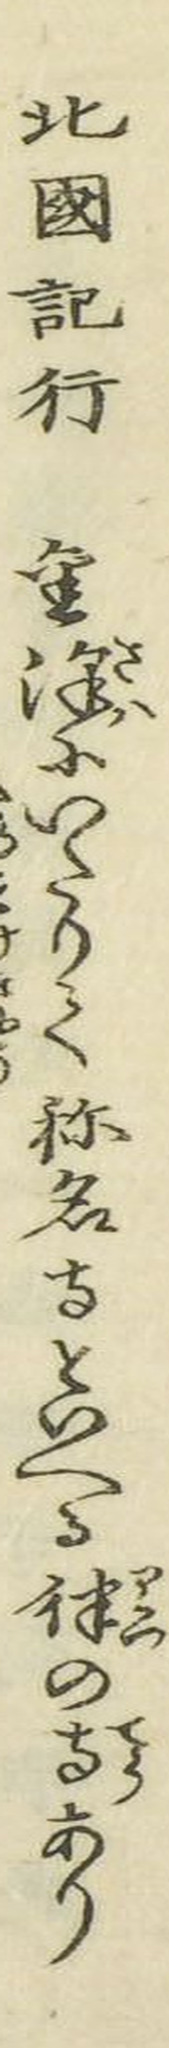北國記行金澤にいたりて称名寺といへる律の寺あり
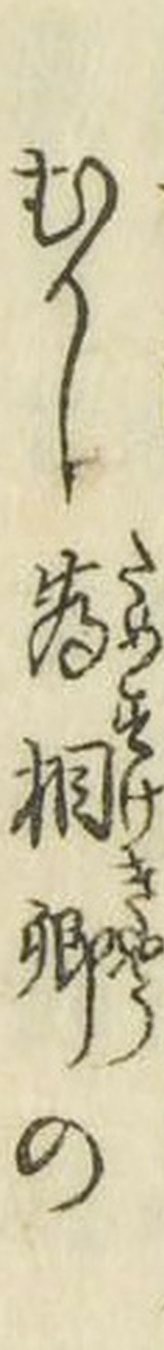むかし爲相卿の
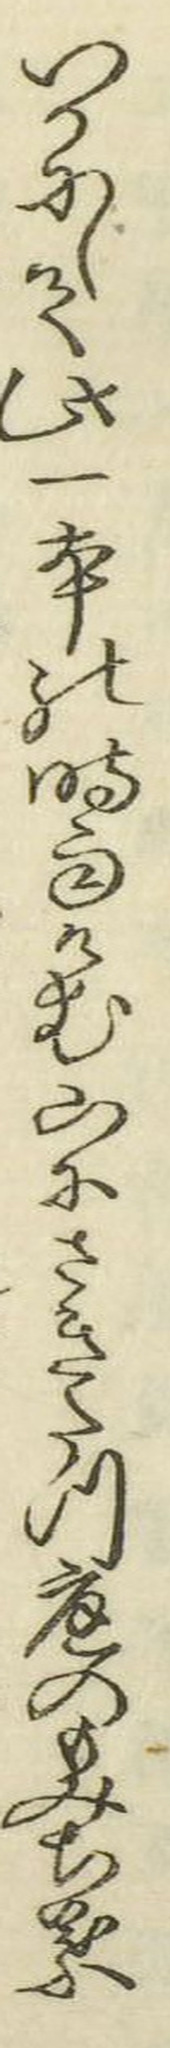いかにして此一本の時雨けむ山にさきたつ庭のもみち葉
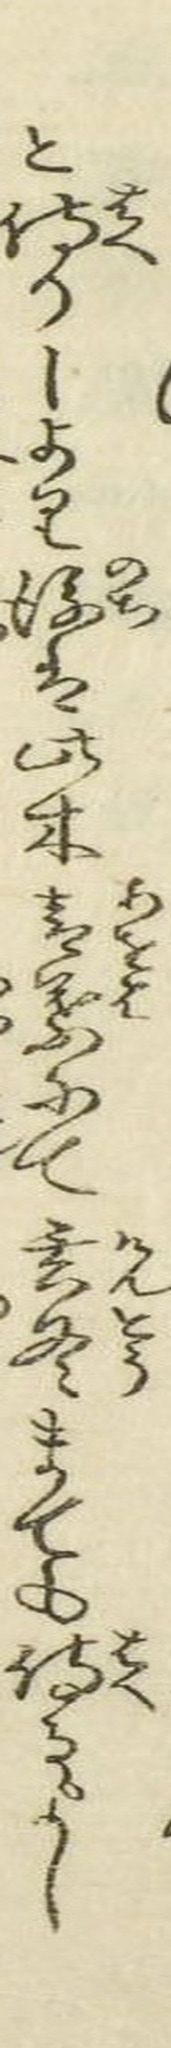と侍りしより後は此木青葉にて玄冬まても侍るよし
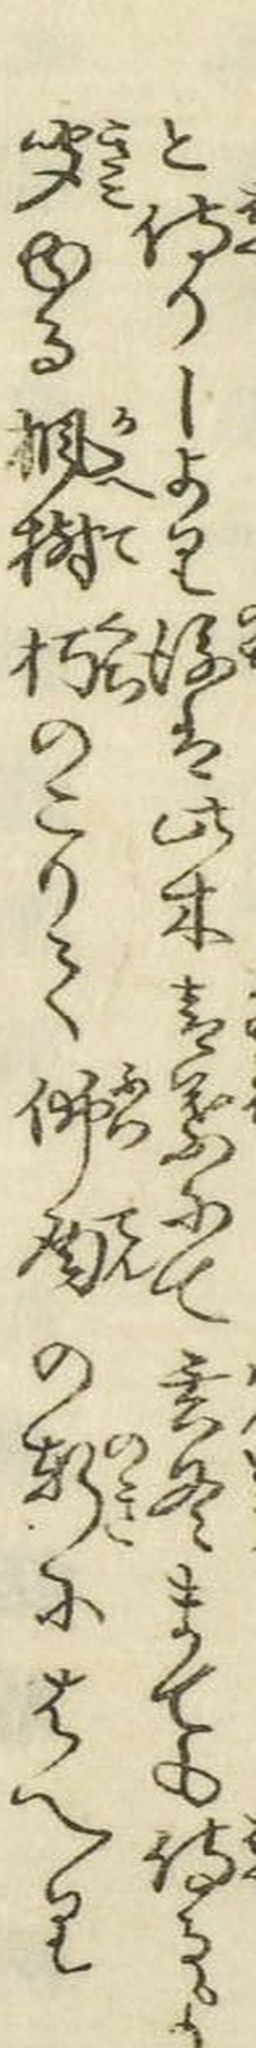聞ゆる楓樹朽のこりて佛殿の軒にはへり
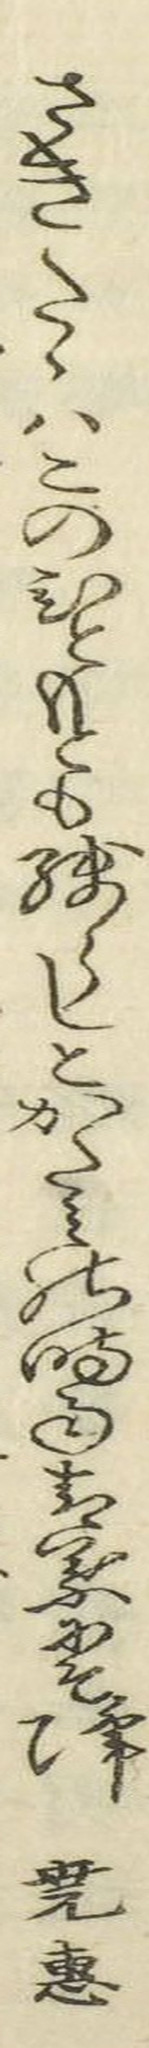さきたゝはこのひともとも残らしとかたみの時雨青葉にそ降堯惠
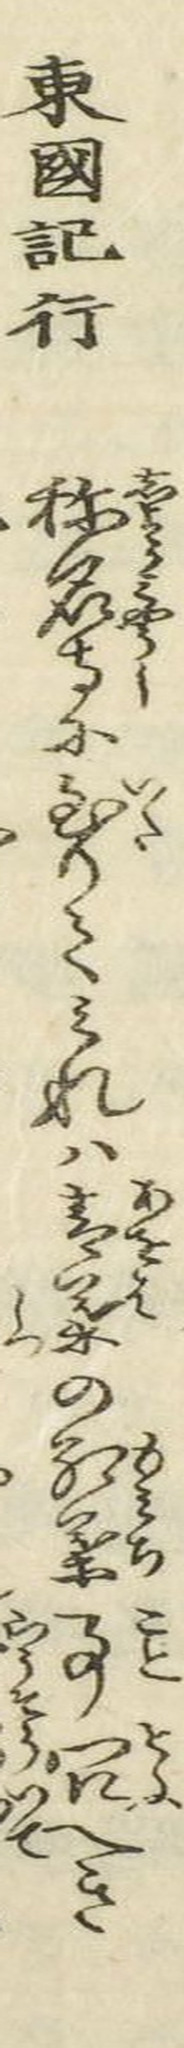東國記行称名寺に至りてみれは青葉の紅葉事問へき
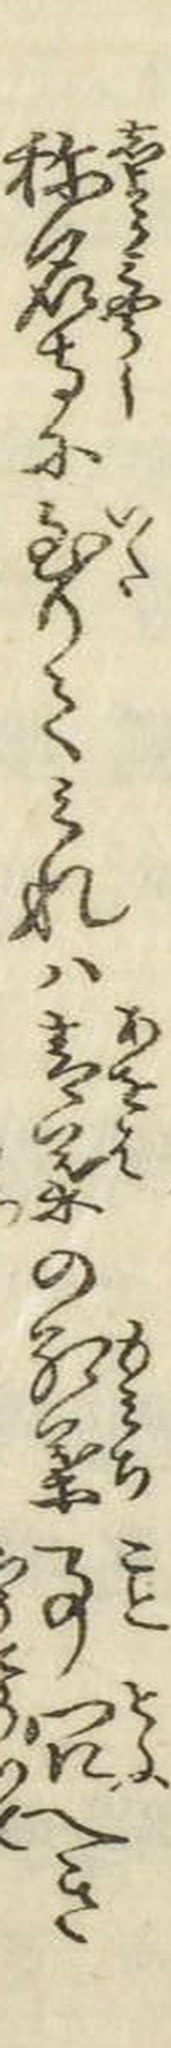東國記行称名寺に至りてみれは青葉の紅葉事問へき
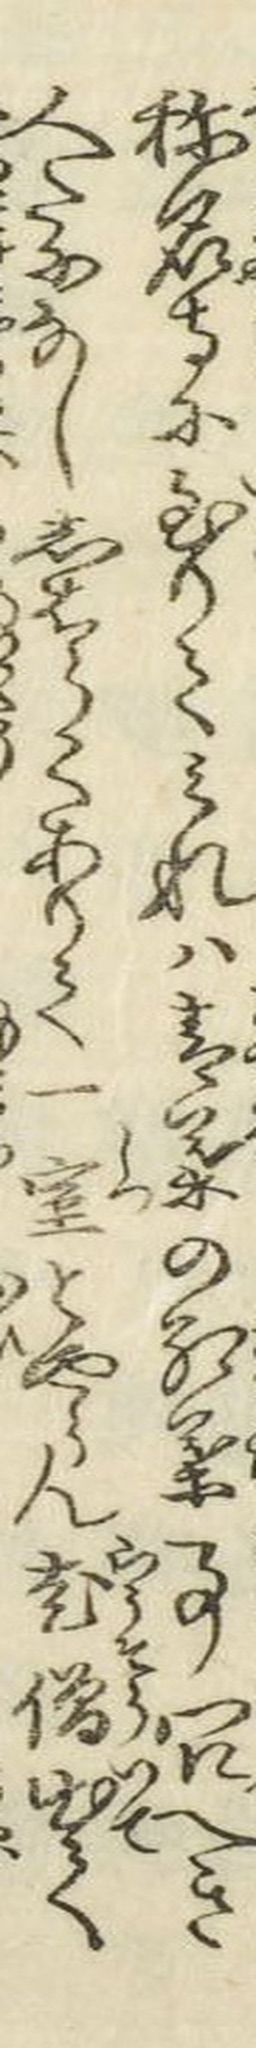人たになししはらくありて一室とやらん老僧出て
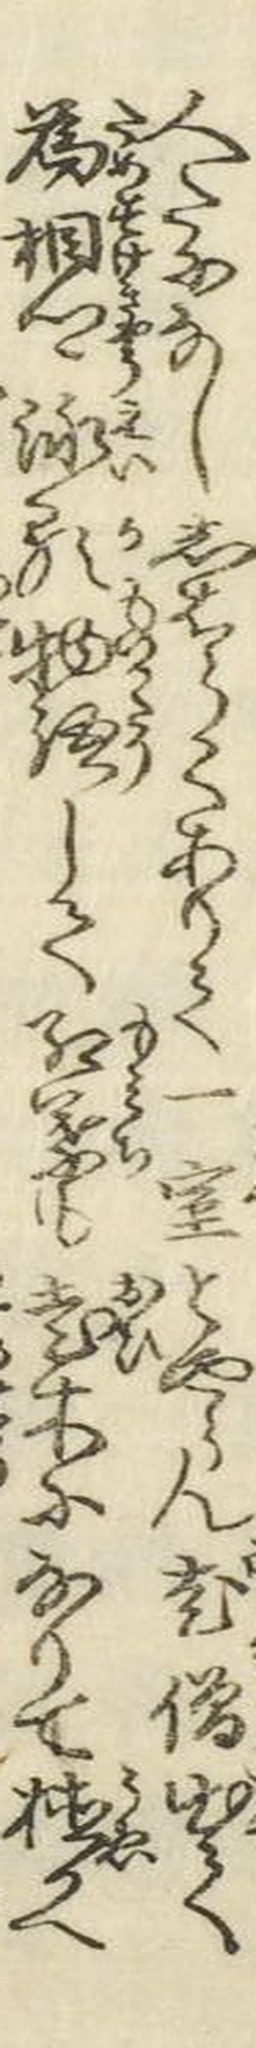為相卿詠歌物語して紅葉も老木になりて植かへ
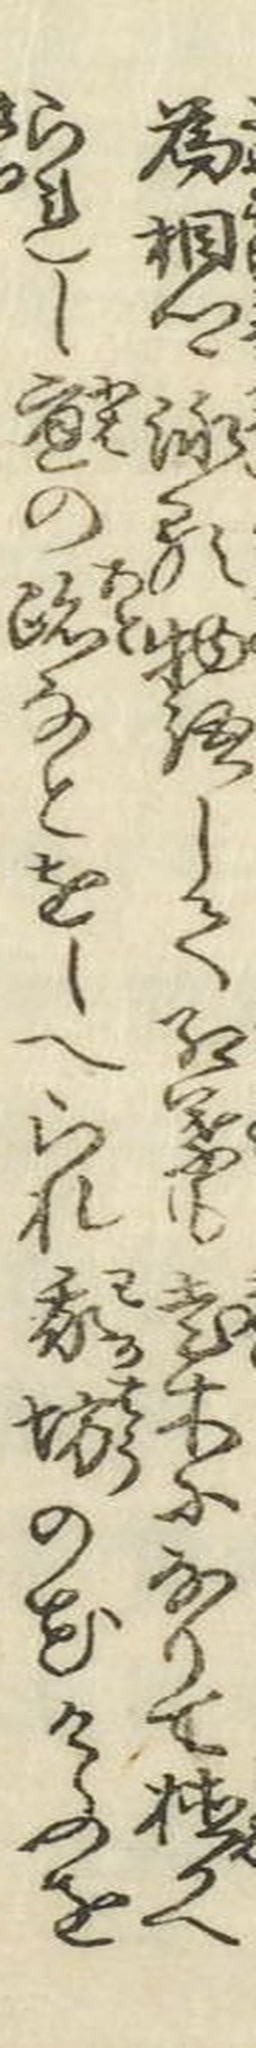られし庭の跡なとをしへられ我坊の花けふを
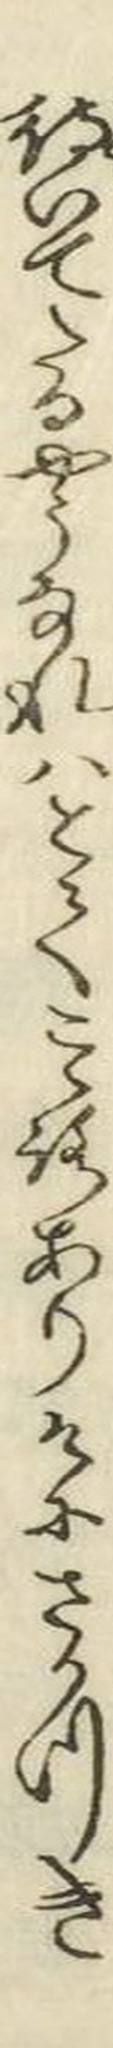待いてたるやうなれはとてこゝろありけにさかつき
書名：江戸名所図会 20巻 巻之6
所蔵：東京学芸大学教育コンテンツアーカイブ
